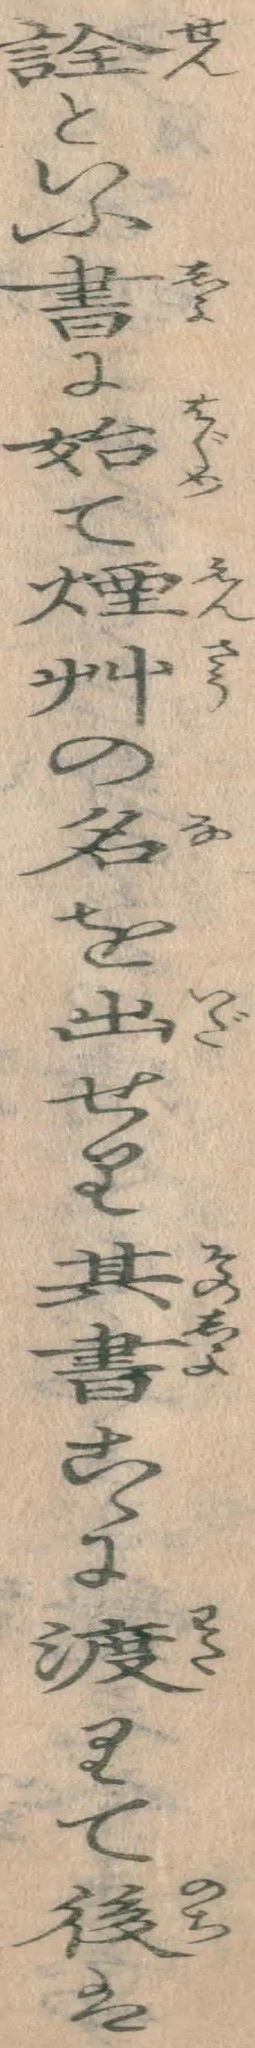詮といふ書に始て煙艸の名を出せり其書こゝに渡りて後は
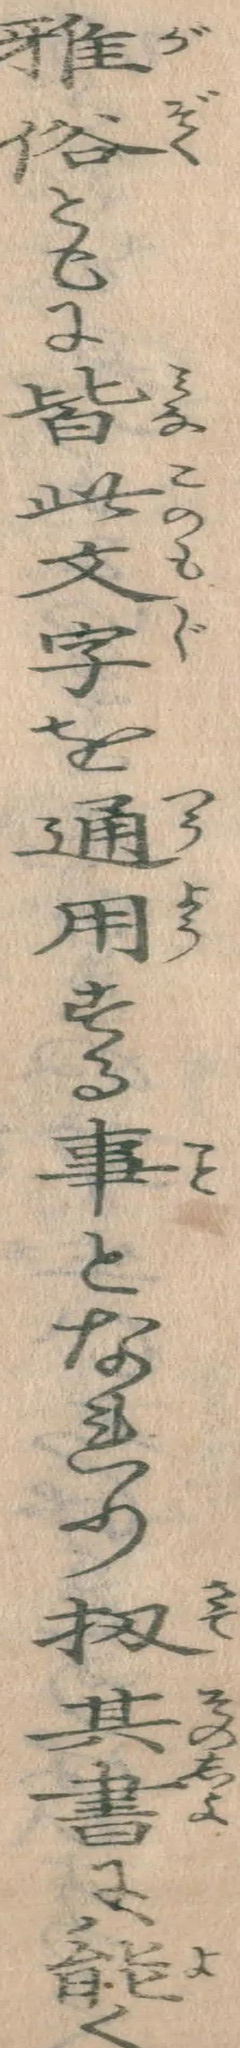雅俗ともに皆此文字を通用する事となれり扨其書には能く
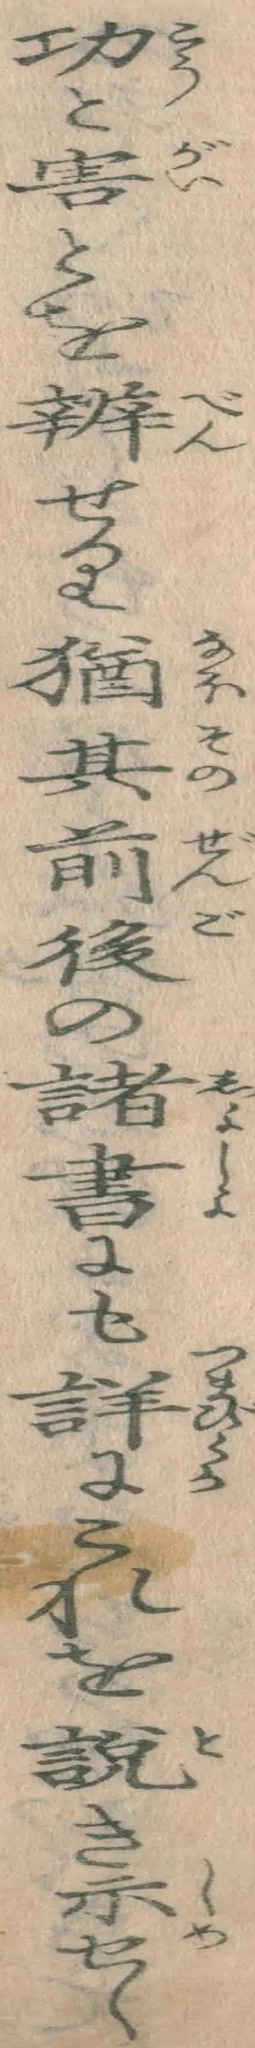功と害とを弁せり猶其前後の諸書にも詳にこれを説き示せし
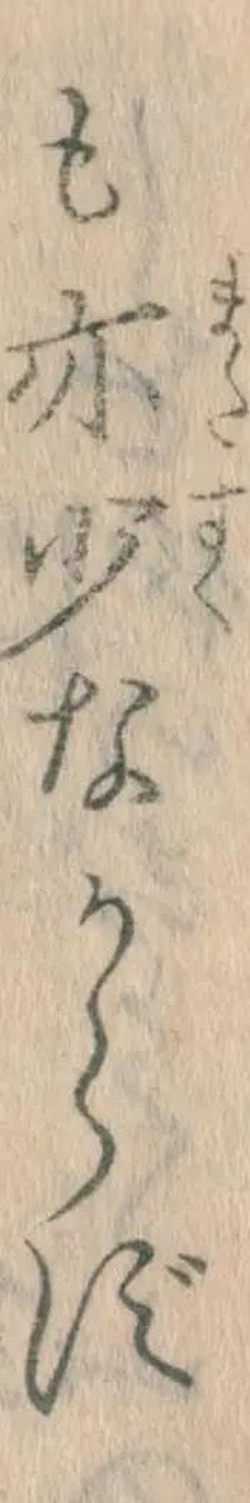も亦少なからず
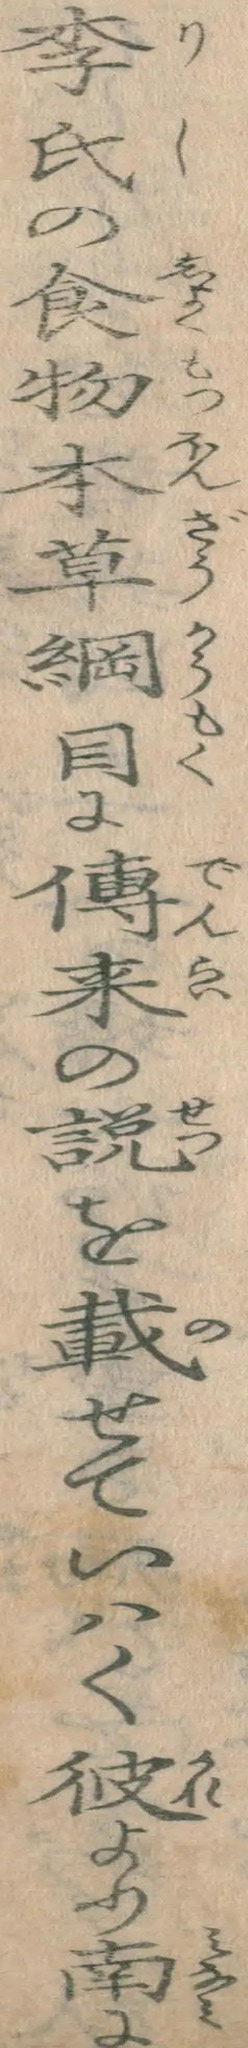李氏の食物本草綱目に伝来の説を載せていはく彼より南に
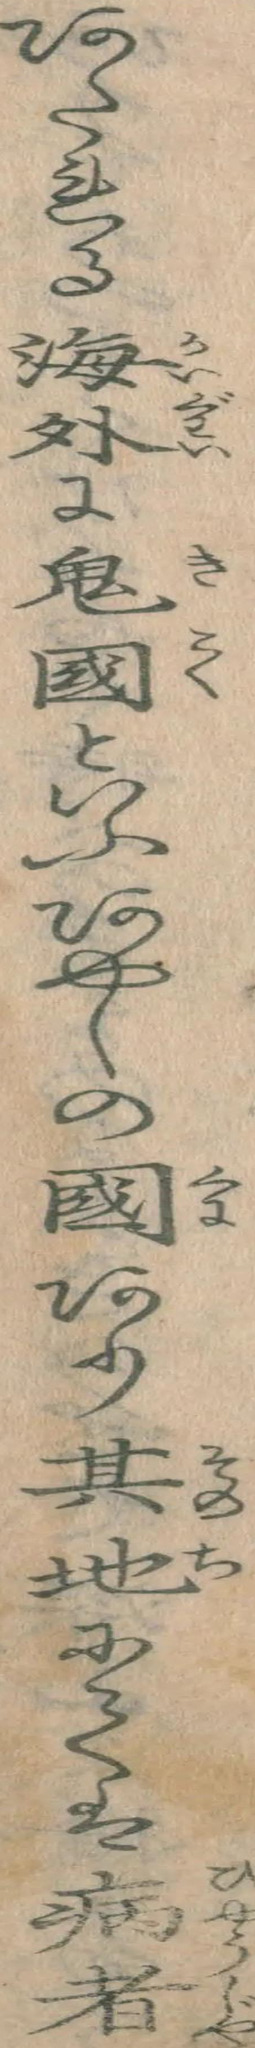あたれる海外に鬼国といふあやしの国あり其地にては病者

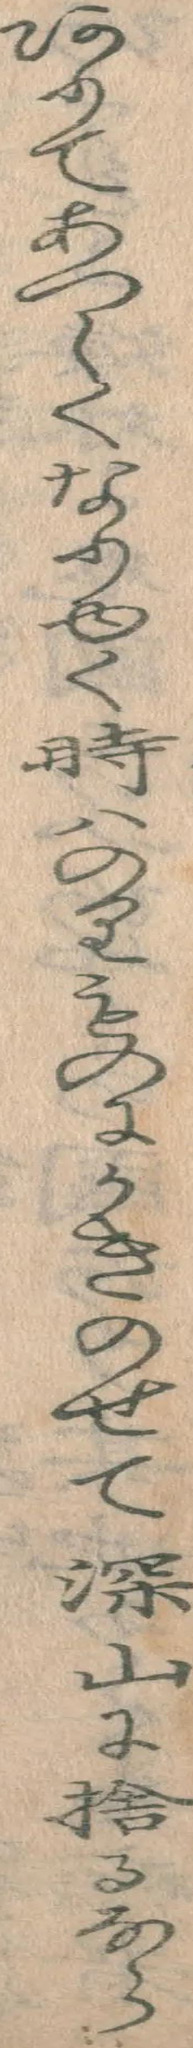ありてあつしくなりゆく時はのりものにかきのせて深山に捨るなら
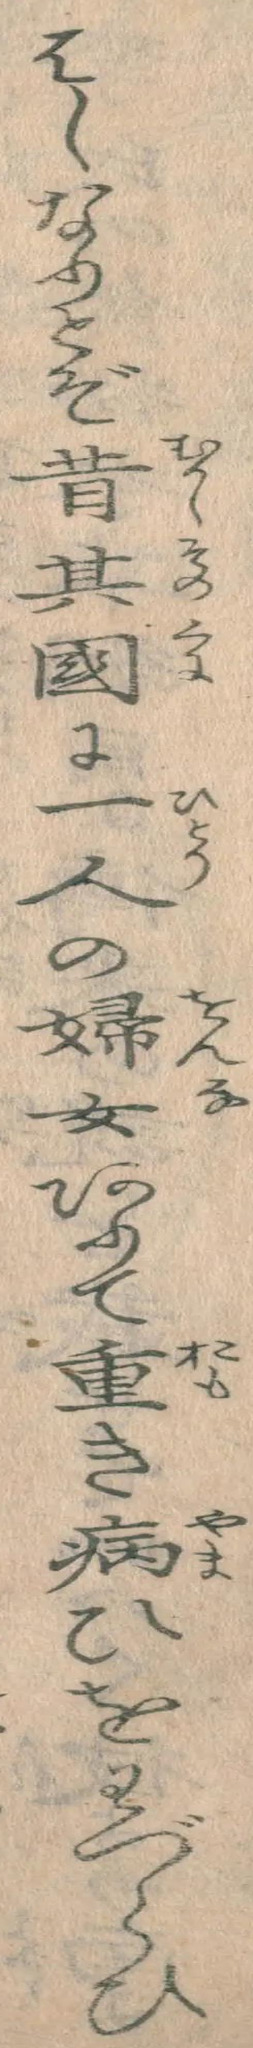はしなりとぞ昔其国に一人の婦女ありて重き病ひをわづらひ
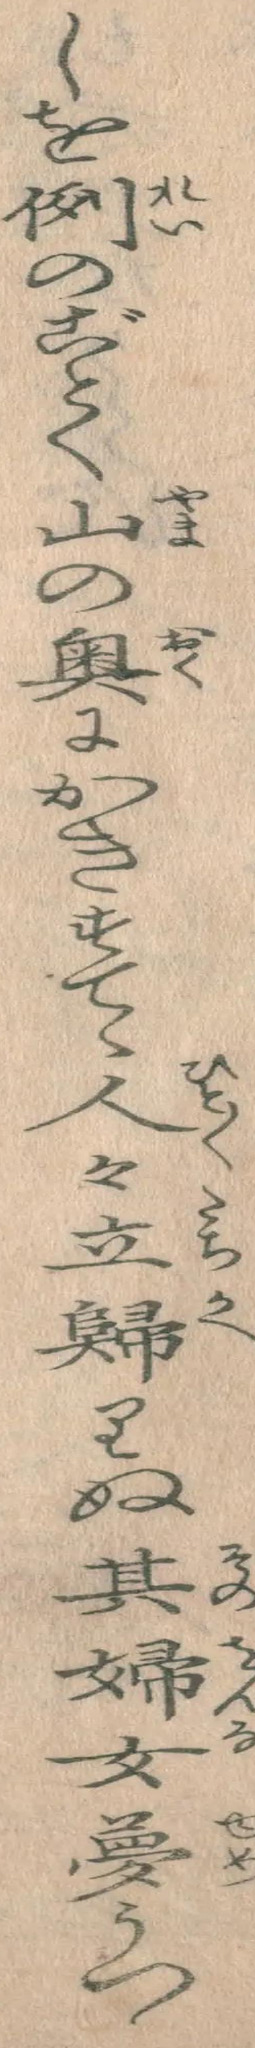しを例のごとく山の奥にかきすてゝ人々立帰りぬ其婦女夢うつ
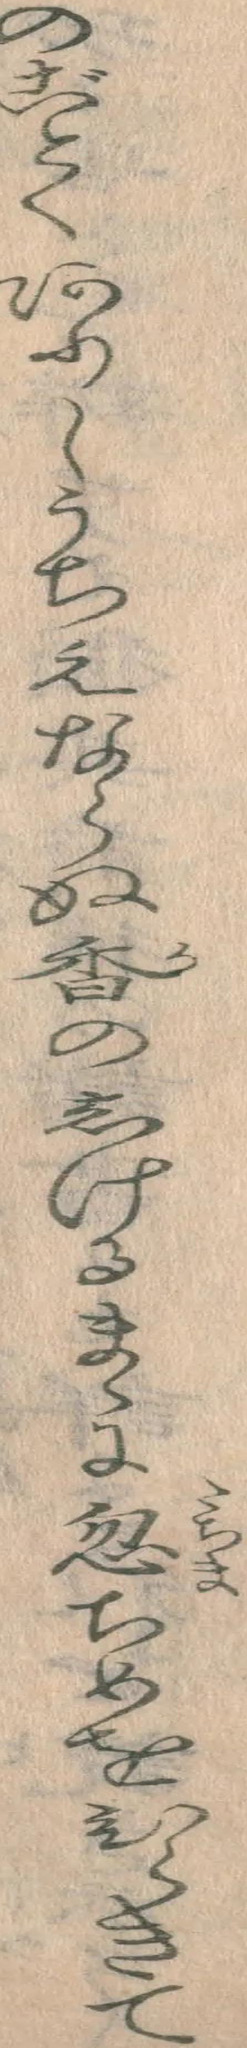のごとくありしうちえならぬ香のしけるまゝに忽ちめをひらきて
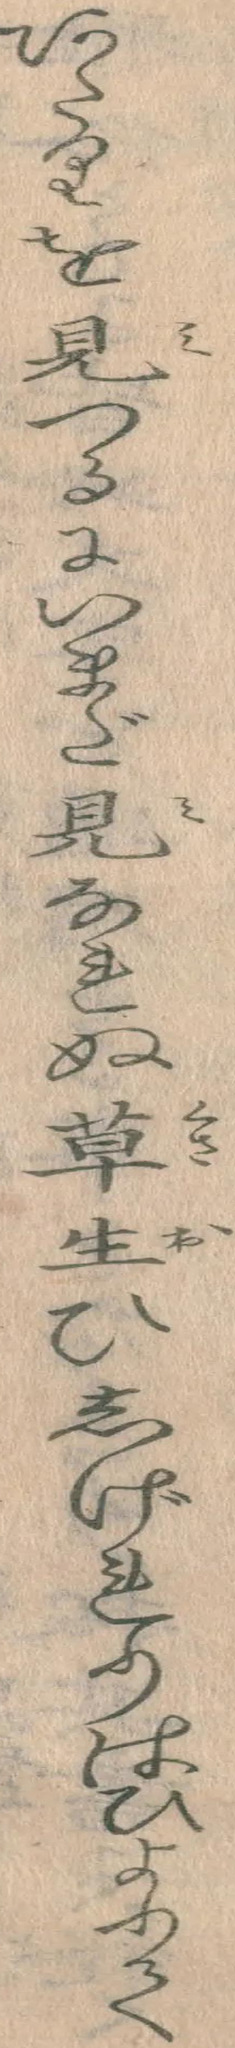あたりを見つるにいまだ見なれぬ草生ひしげれりはひよりて
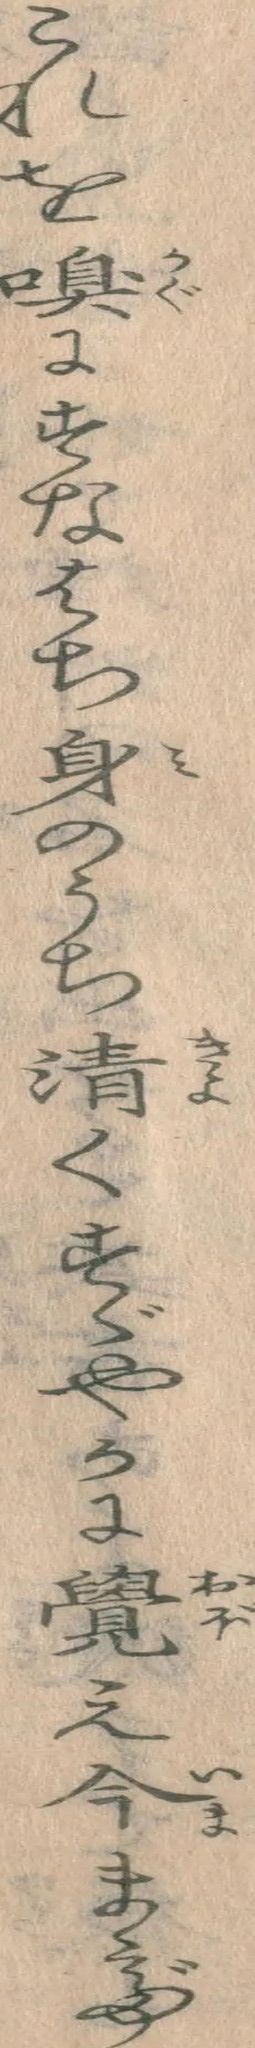これを嗅にすなはち身のうち清くすゞやかに覚え今まで
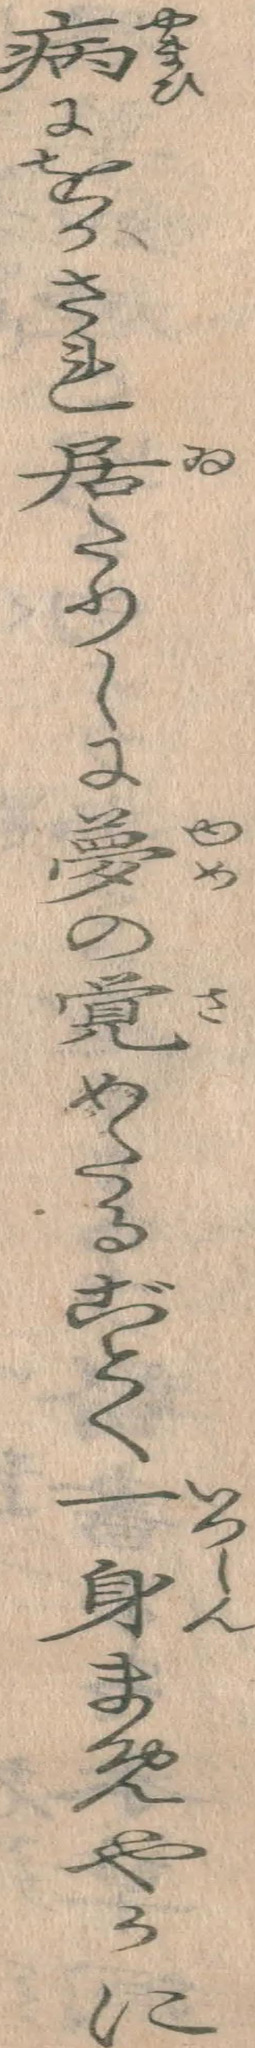病にをかされ居たりしに夢の覚めたるごとく一身まめやかに
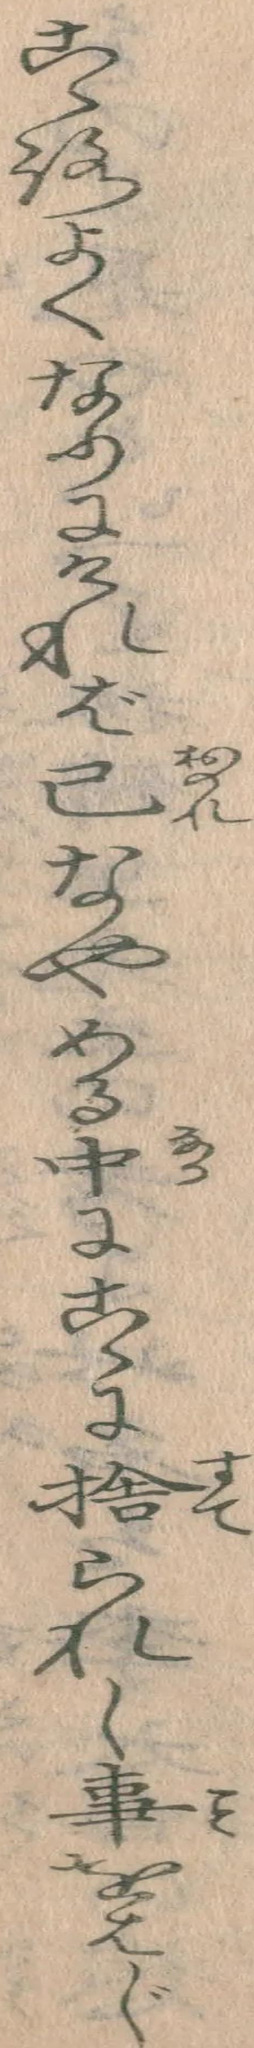こゝろよくなりにければ己なやめる中にこゝに捨られし事をはじ
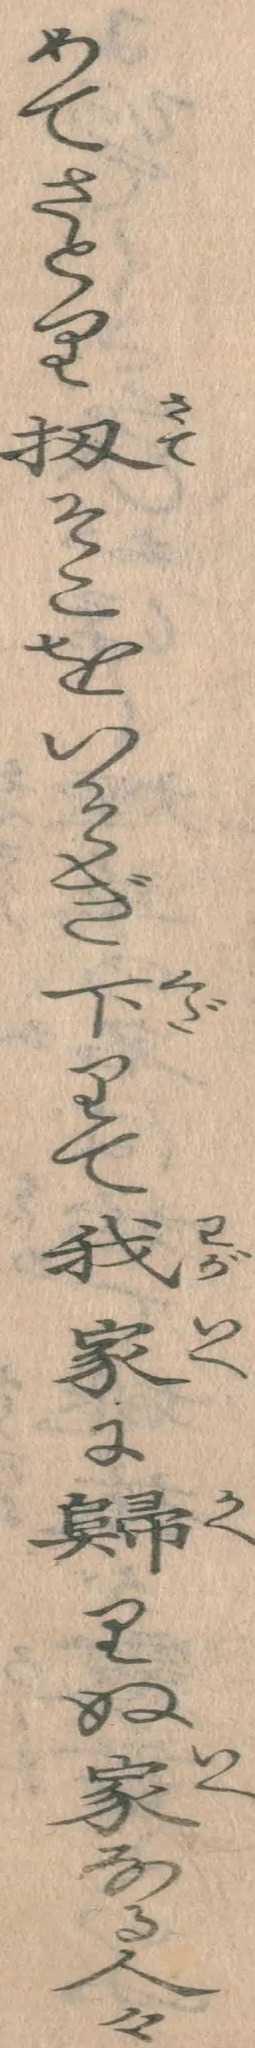めてさとり扨そこをいそぎ下りて我家に帰りぬ家なる人々
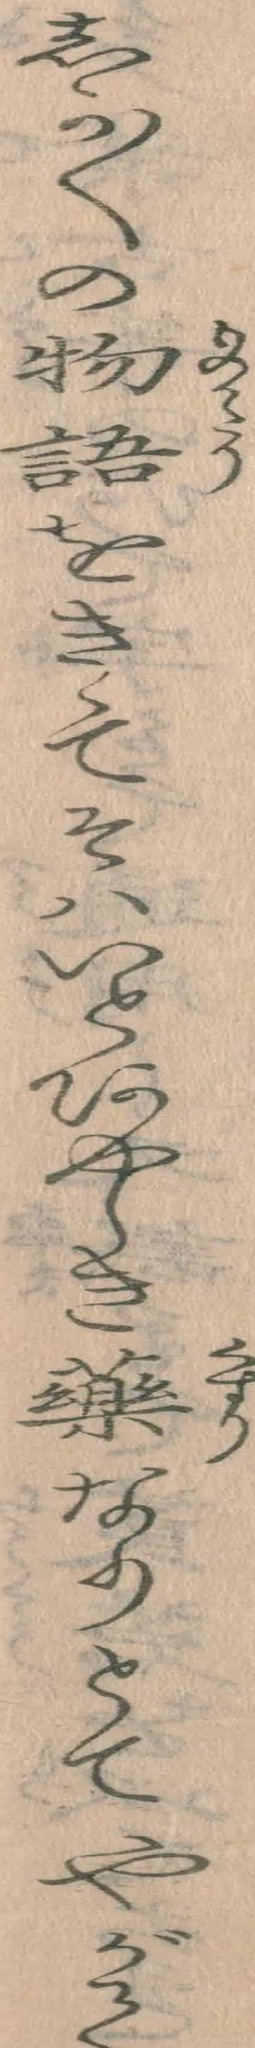しか〳〵の物語をきゝてそはいとあやしき薬なりとてやがて
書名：目さまし草
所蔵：国立国会図書館 National Diet Library, JAPAN
